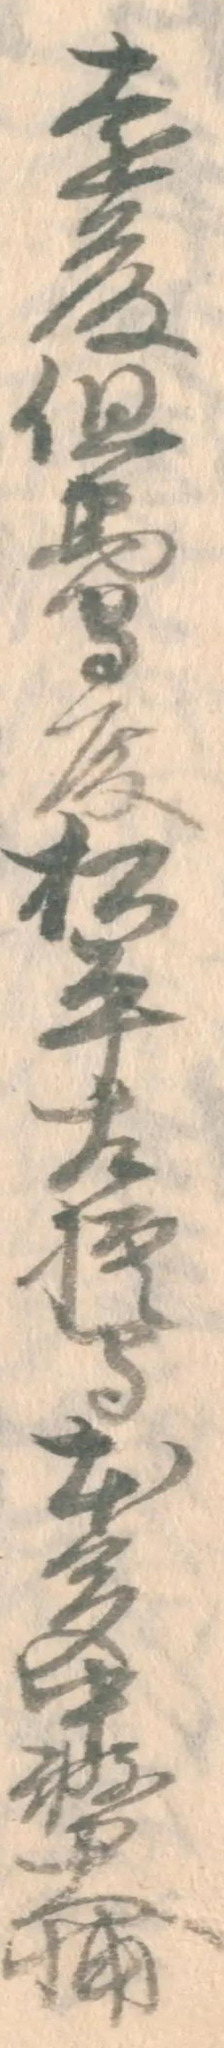遠藤但馬守殿松平相模守本多中務大輔
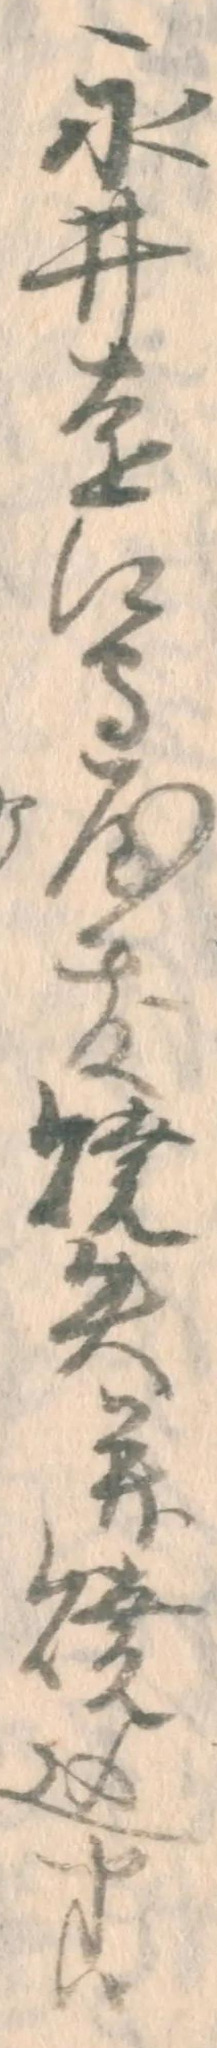永井遠江守屋敷焼失幷焼込申候
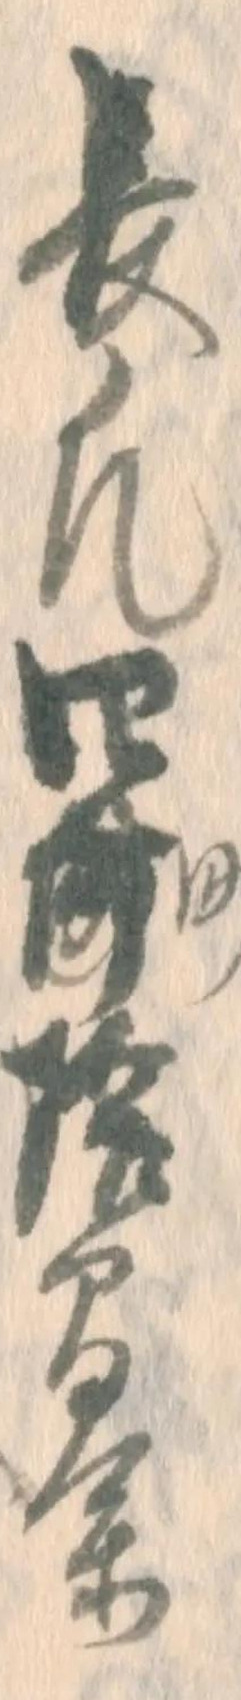長凡四町拾間余
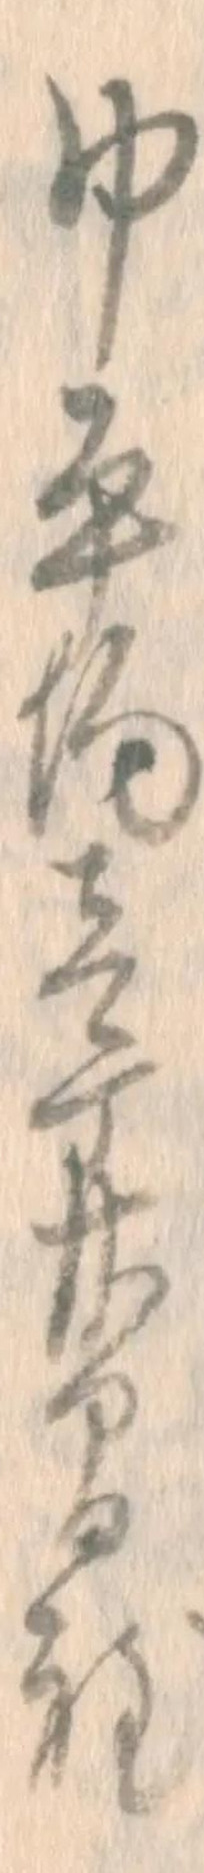幅平均壱丁廿間程
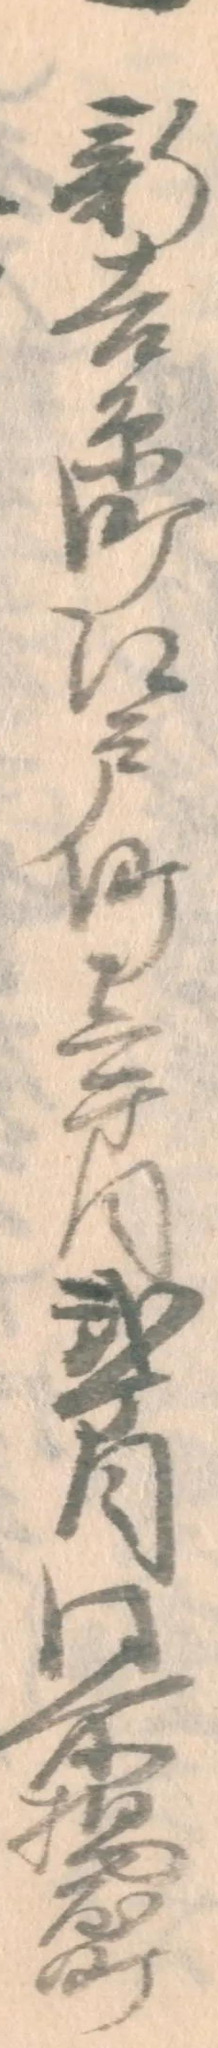一新吉原町江戸町壱丁目弐丁目同所揚屋町
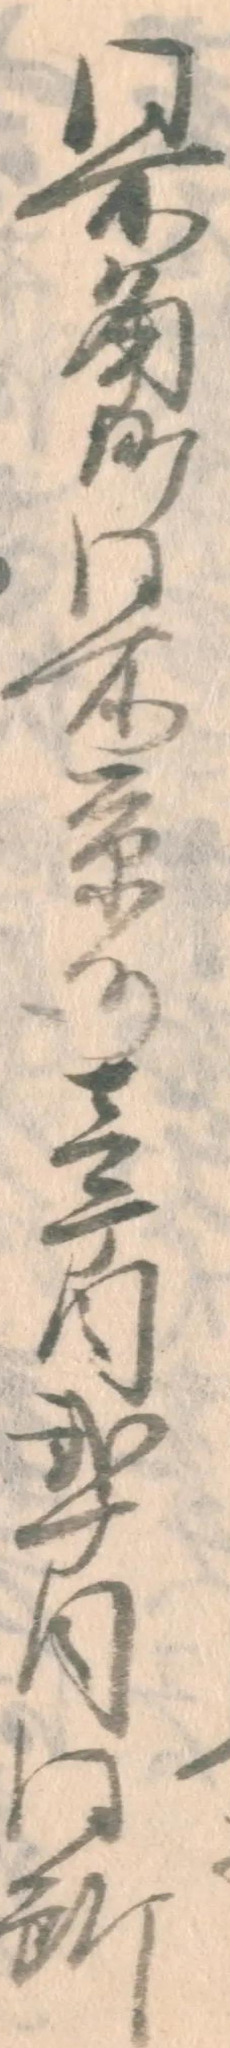同所角町同所京町壱丁目弐丁目同所
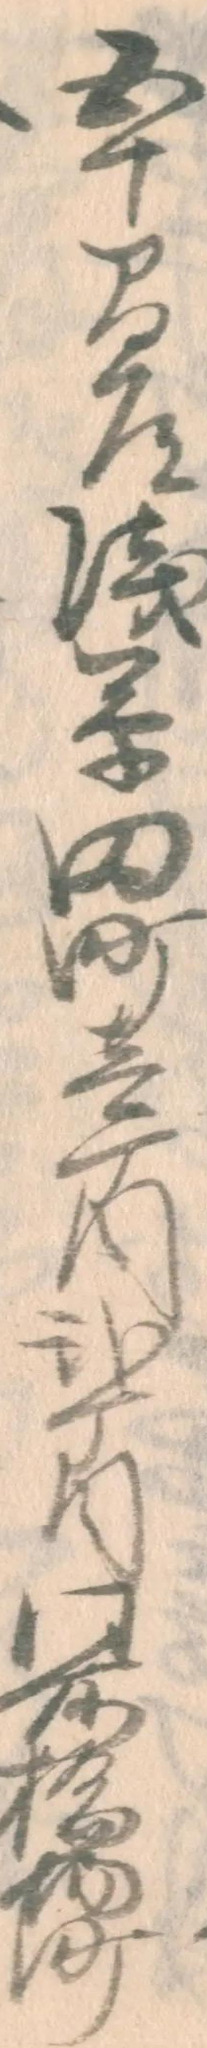五十間道浅草田町壱丁目弐丁目同所橋場町
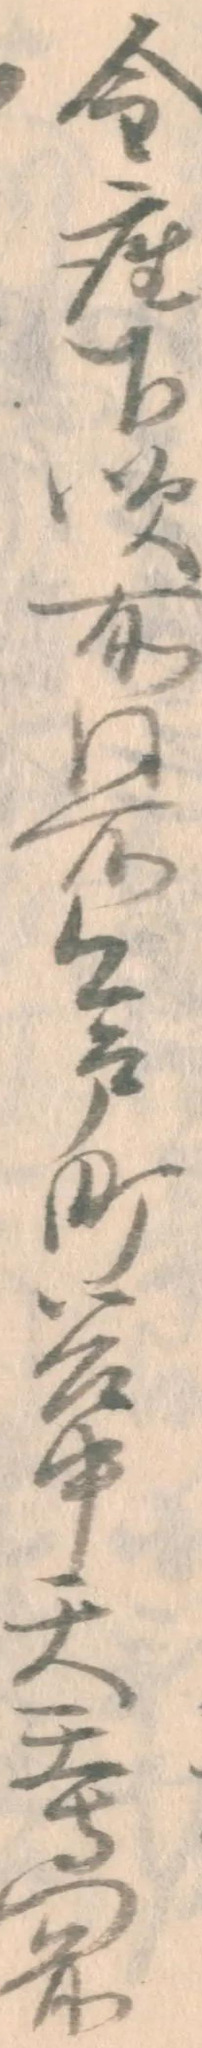金座下吹所同所今戸町谷中天王寺門前
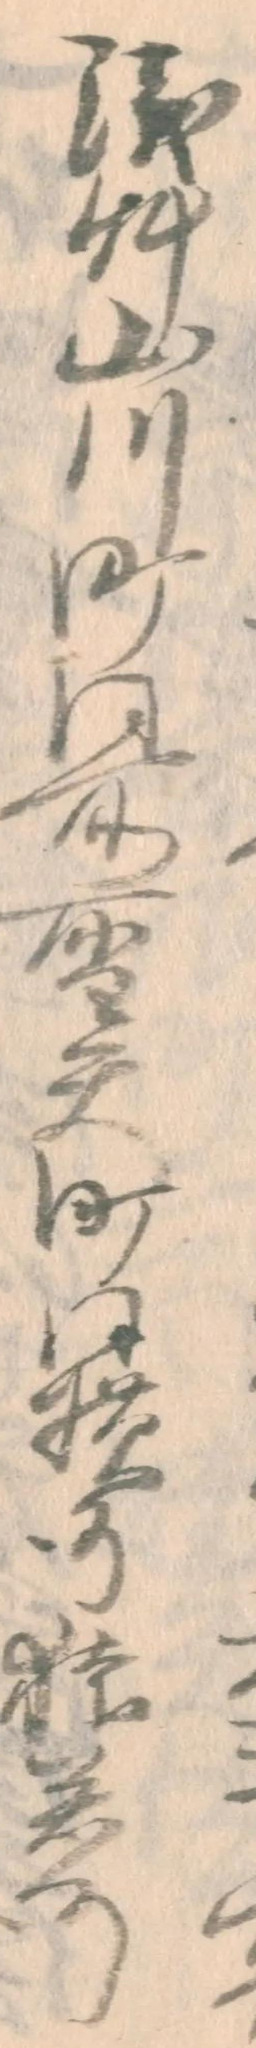浅草山川町同所聖天町同横町猿若町
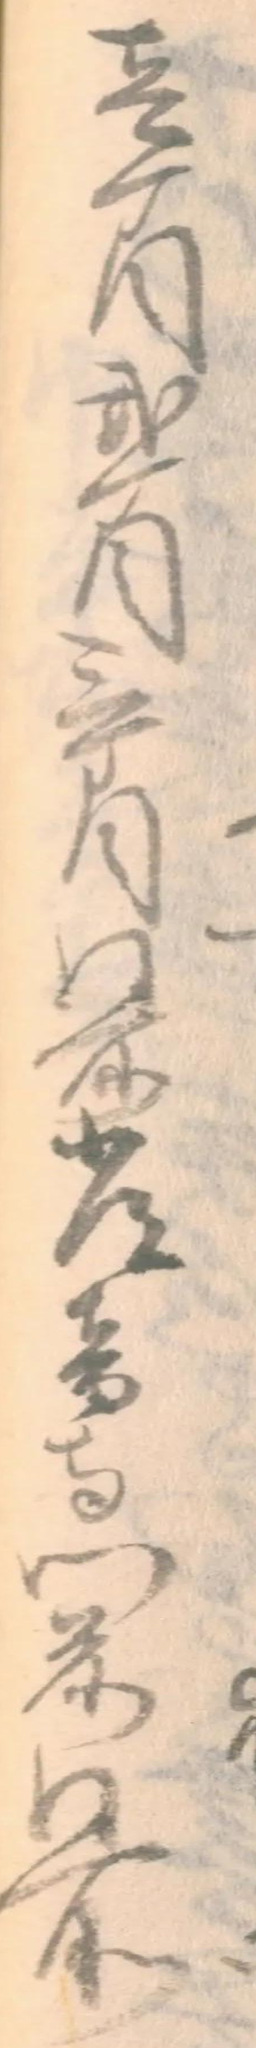壱丁目弐丁目三丁目同所常寺門前同所
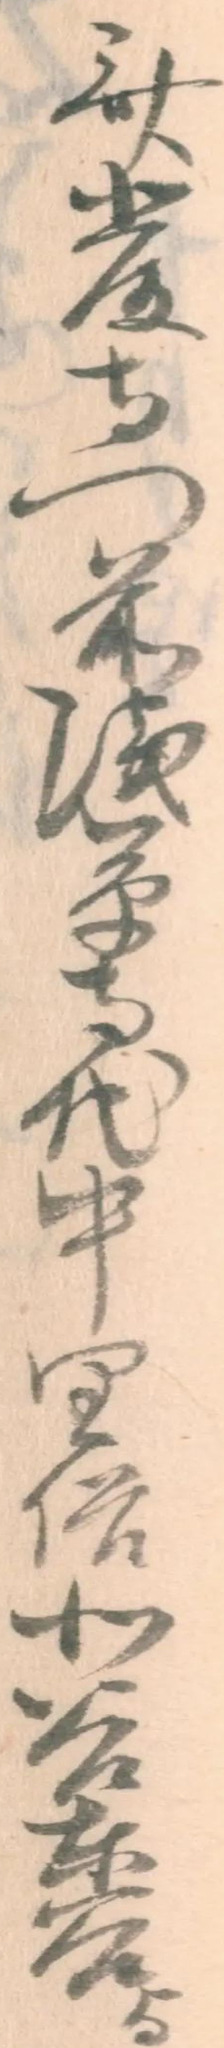寺門前浅草寺代中里俗北谷東谷と
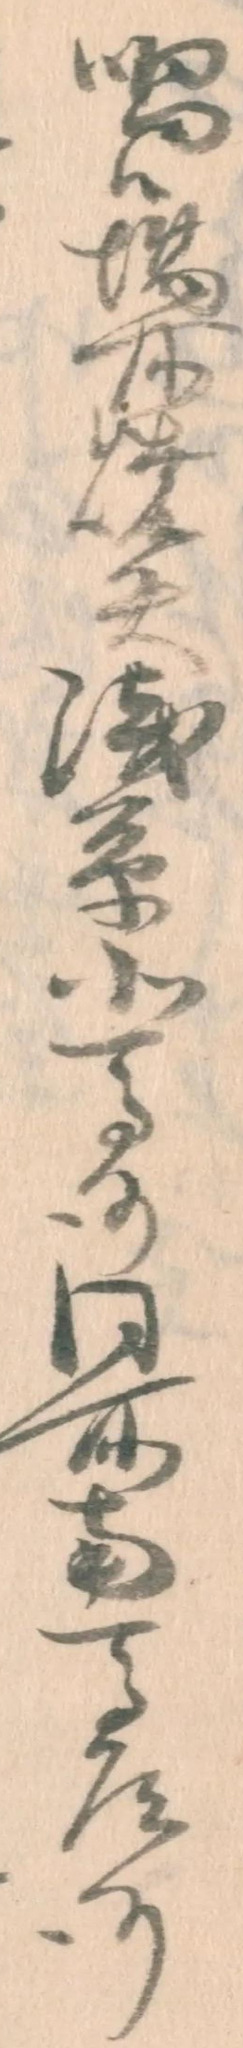唱候場所焼失浅草北馬町同所南馬屋町
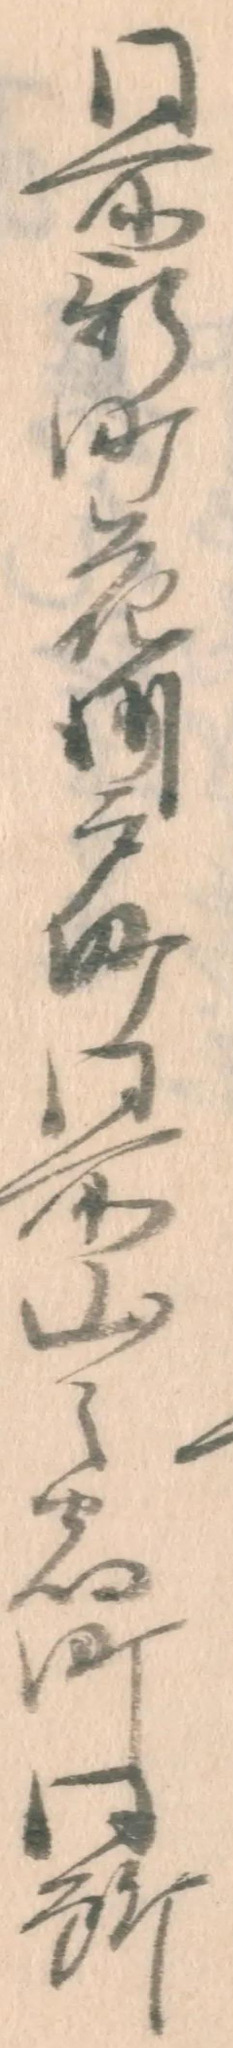同所新町花川戸町同所山之宿町同所
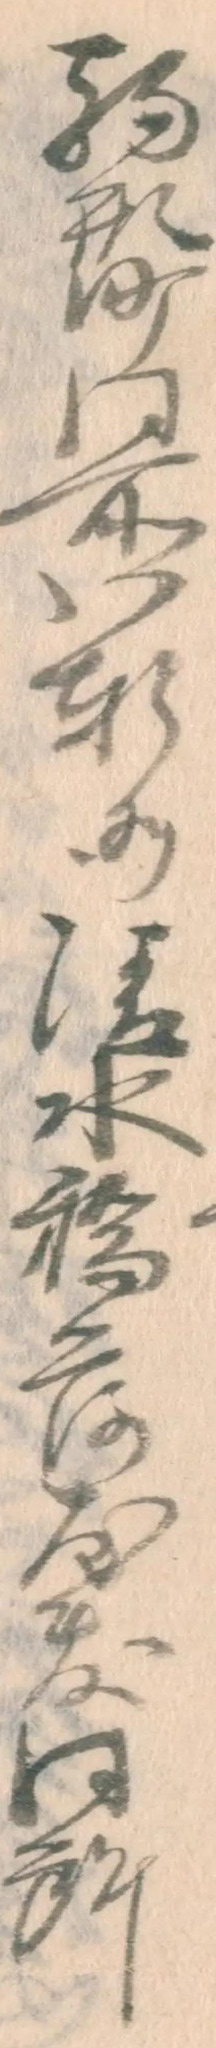駒形町同所八軒町清水橋荷屋敷同所
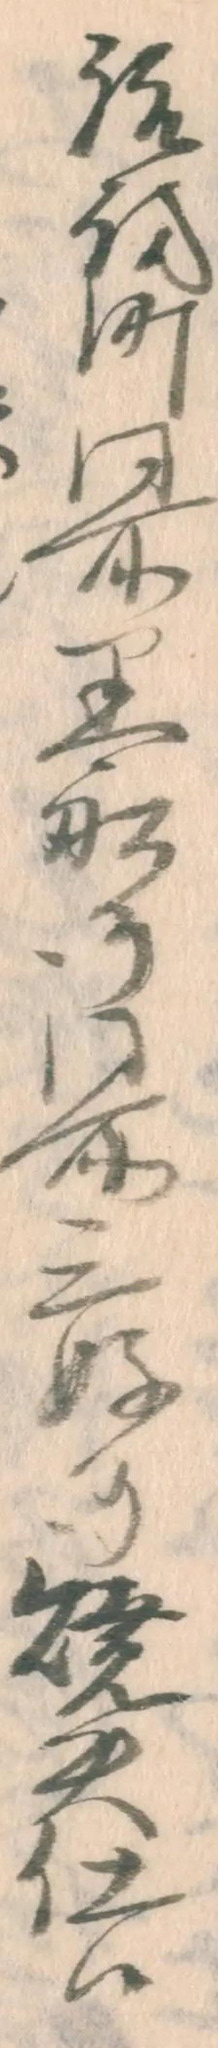諏訪町同所黒船町同所三好町焼失仕候
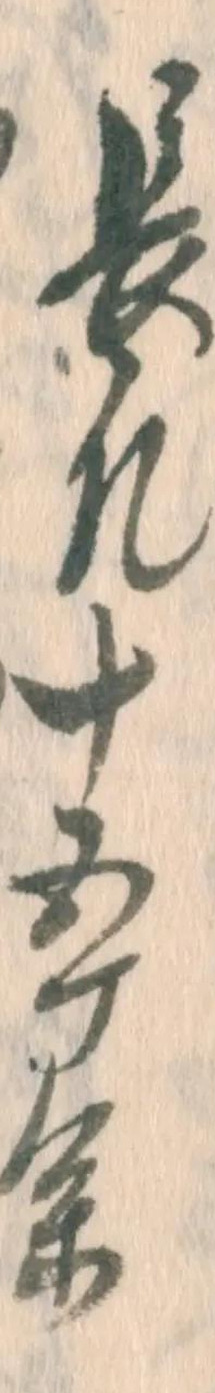長凡十五丁余
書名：地震災書留 2巻. [1] 内表紙に「地震災書留　安政二卯年　但本所深川御用屋敷地代免除調」とあり
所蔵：国立国会図書館 National Diet Library, JAPAN
